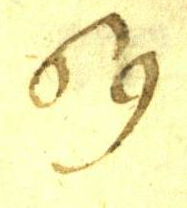69
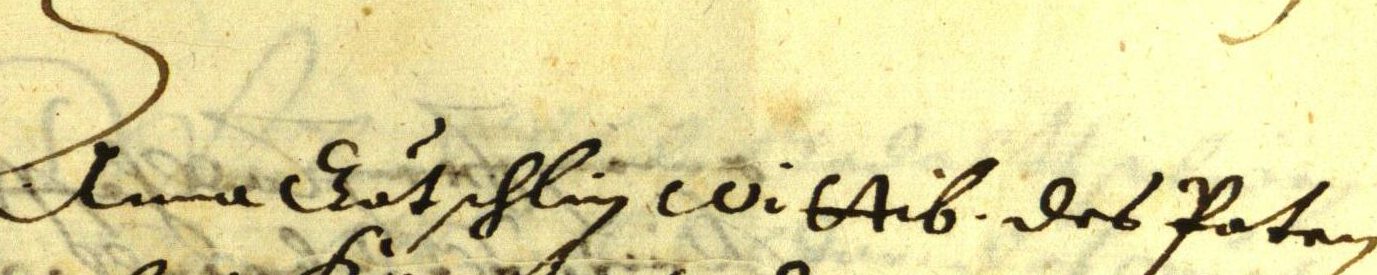Anna Gōtschlin Wittib. des Poten
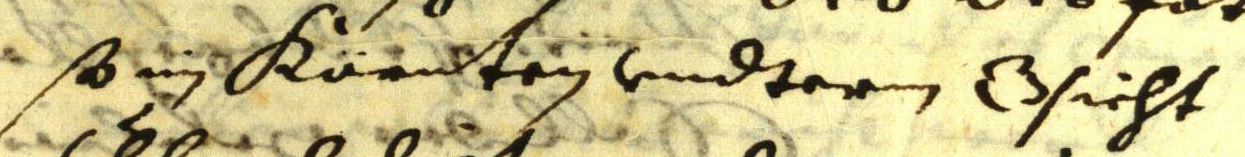so in Kärnten vndterm Gsicht
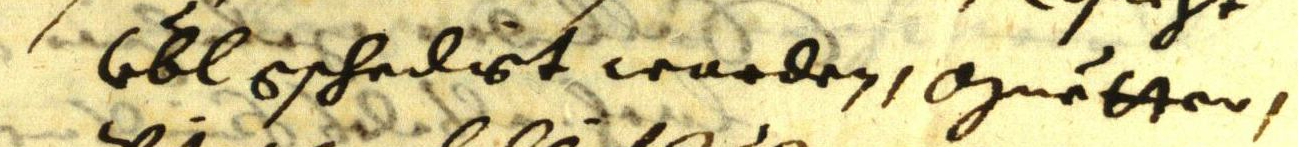v̄bl gschedigt worden, Muētter,
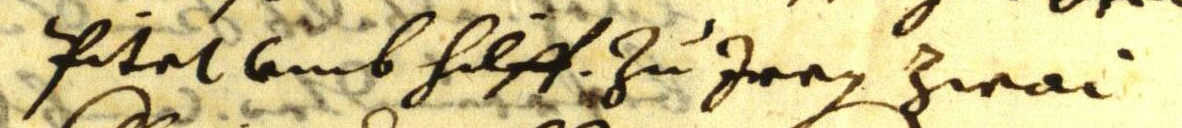Pitet umb hilff. Zū Iren zwai
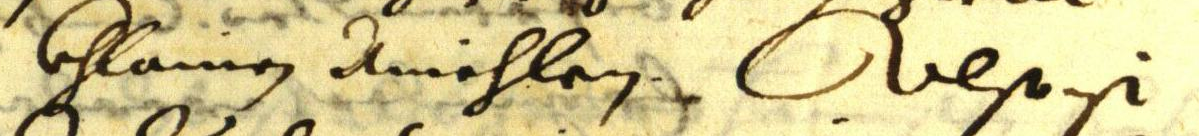klainen Anichlen. Also ist
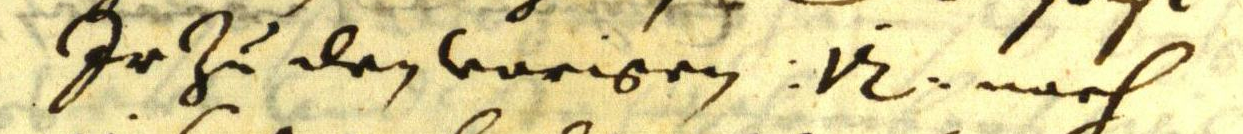Ir Zū den vorigen: 12: noch
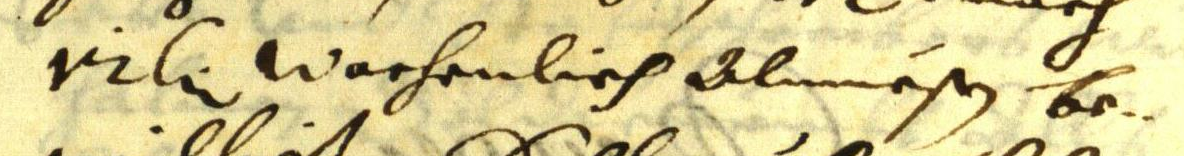12 k. Wochenlich Almūesen be¬
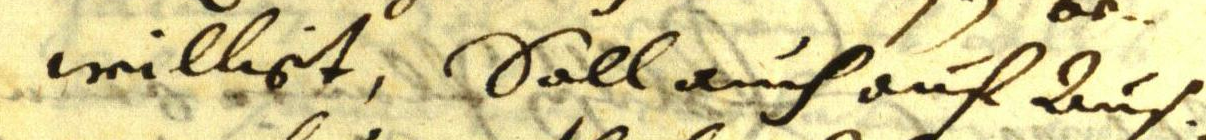willigt, Soll aūch aūf Aūs¬
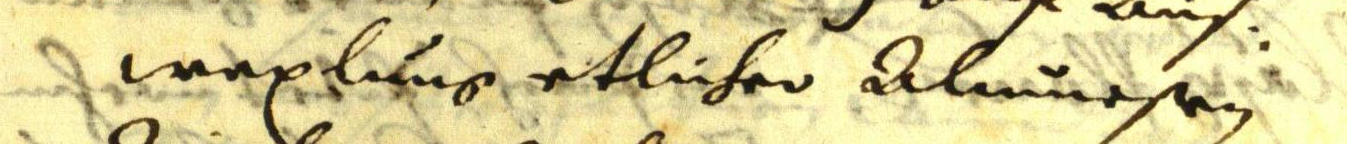wexlūng etlicher Almūesen
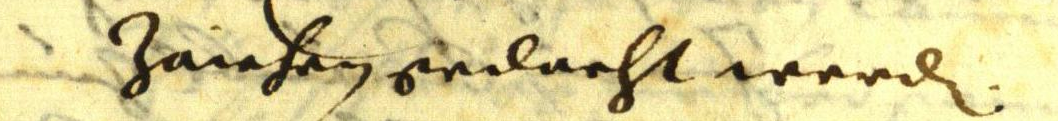Zaichen gedacht werd.
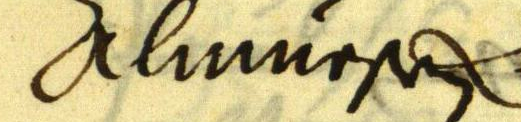Almūesen
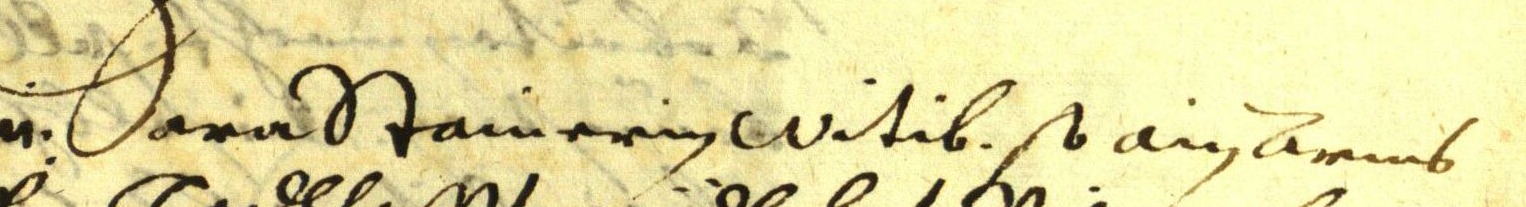Sara Steinerin Witib. so ain Arms
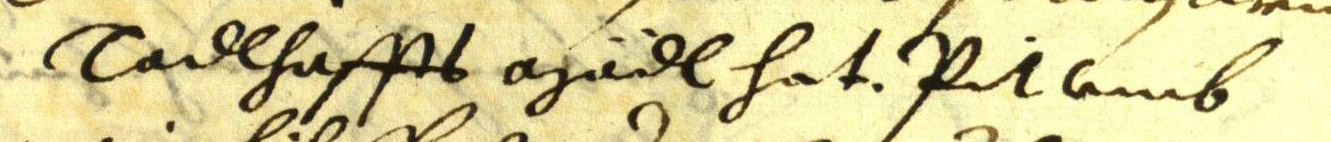Todlhaffts Mädl hat. Pit umb
